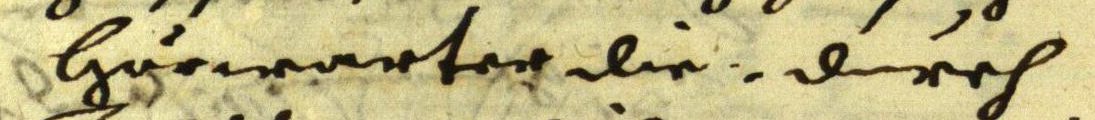Hōrwarter die. dūrch
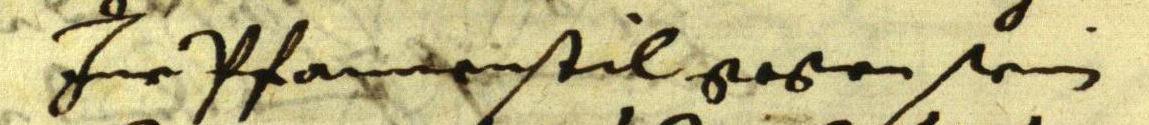Ine Pfannenstil gegen sein
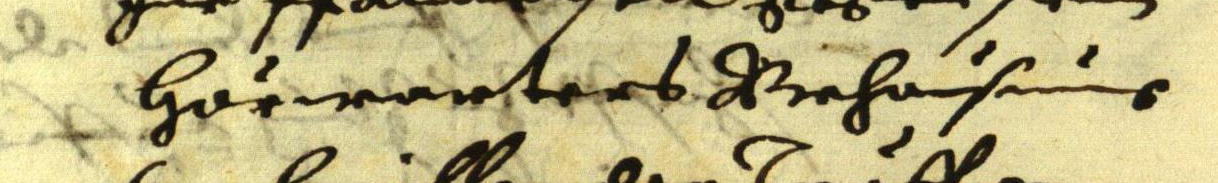Hōrwarters Behaūsūng
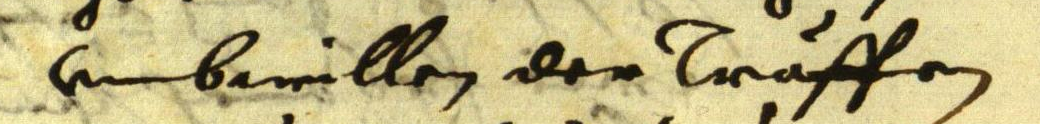umb willen der Trāffen
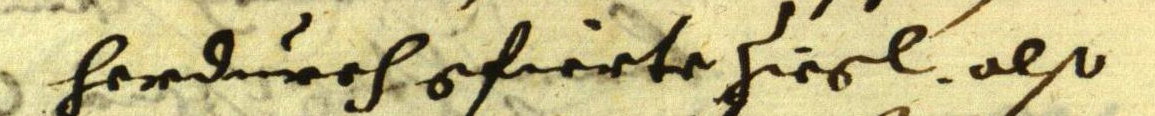herdūrch gefierte Ziegl. also
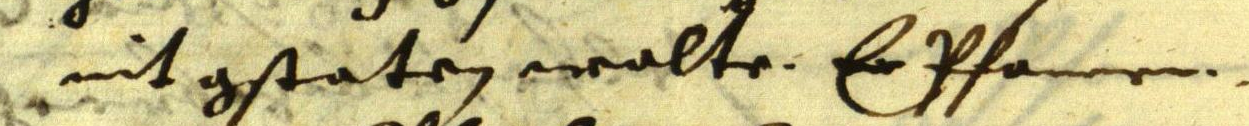nit gstaten wolte. Er Pfannen¬
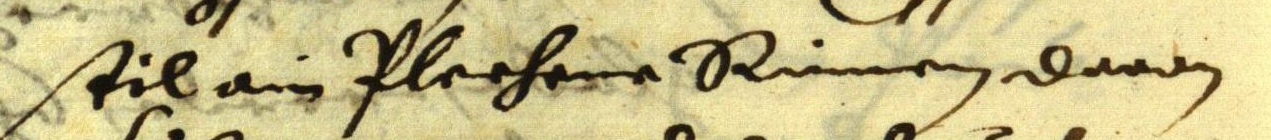stil ain Plechene Rinnen daran
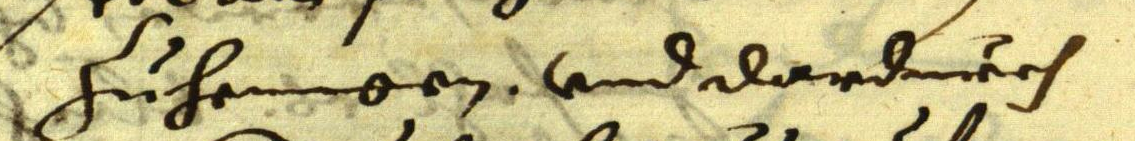Zūhenngen. vnd dardūrch
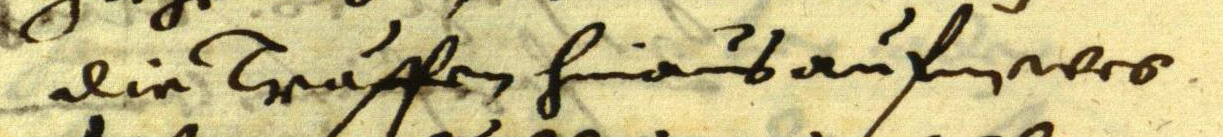die Trāffen hinaūs aūfm weg
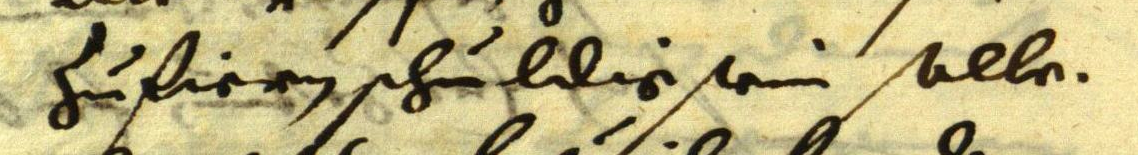Zū fiern schūldig sein solle.
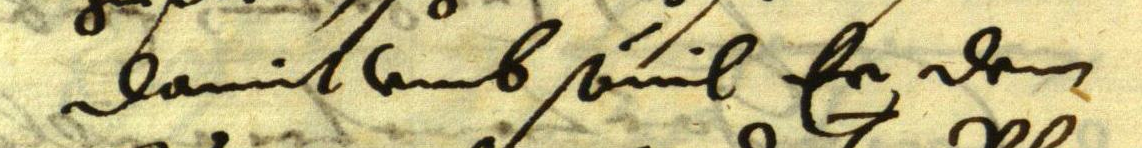Damit umb sōuil Er dem
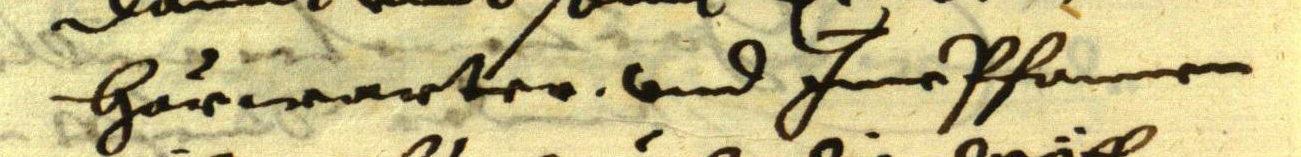Hōrwarter. vnd Ime Pfrannen¬
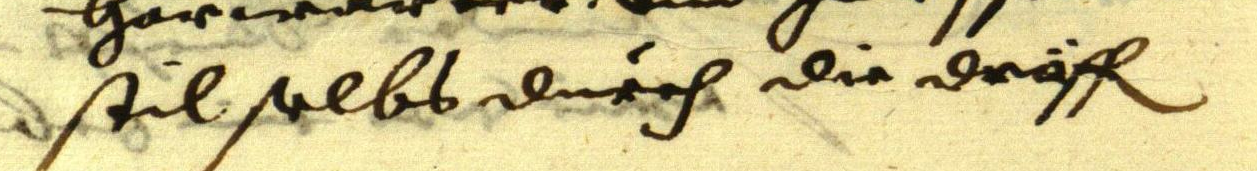stil selbs dūrch die dräff
